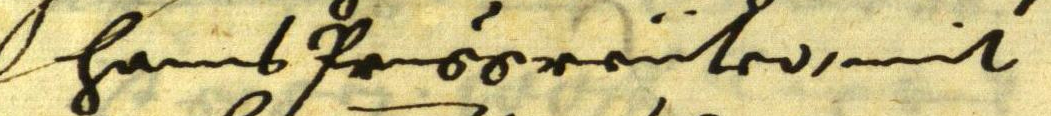hanns Prūggreüter, mit
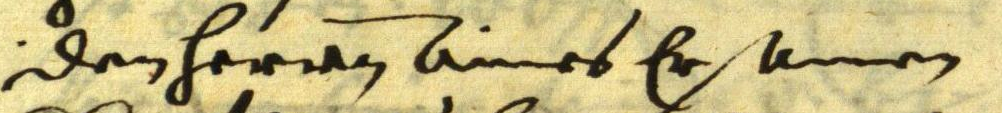den herrn Aines Ersamen
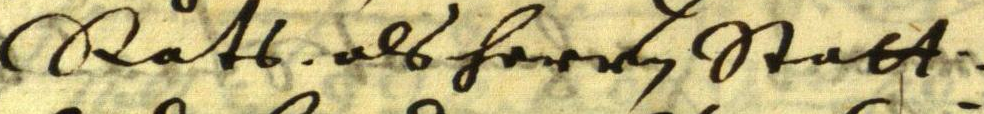Rats. als herrn Statt¬
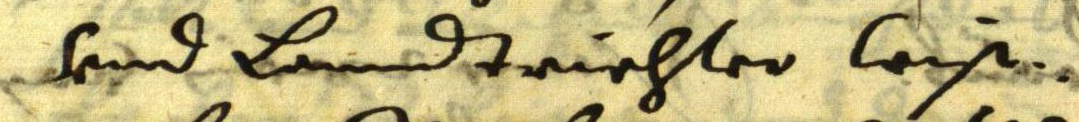vnd Lanndtrichter Crist¬
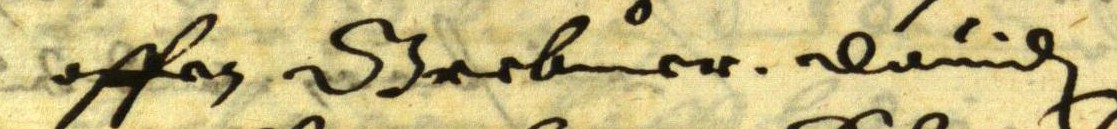offen Grebmer. Daūiden
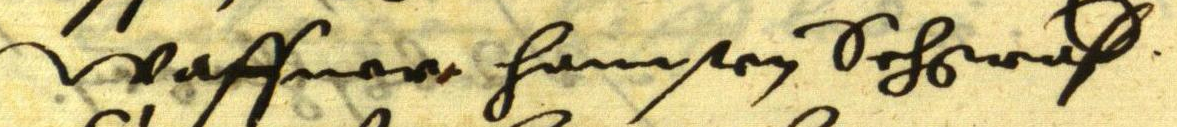Waffner. hannsen Schgraf.
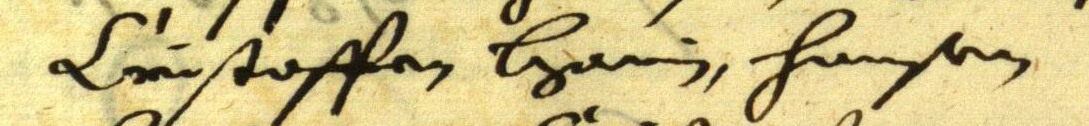Cristoffen Haim, hannsen
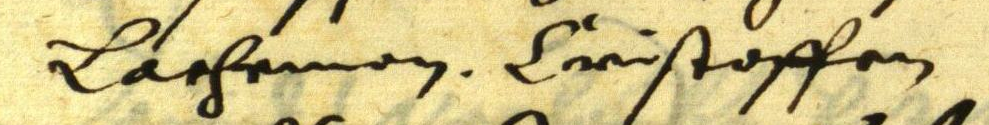Locheman. Cristoffen
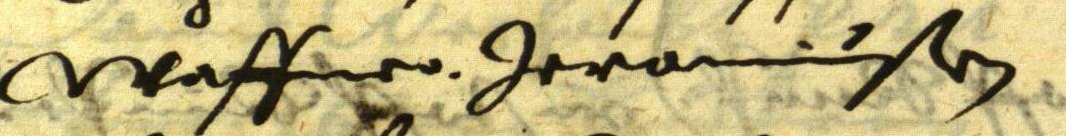Waffner. Jeronimūsen
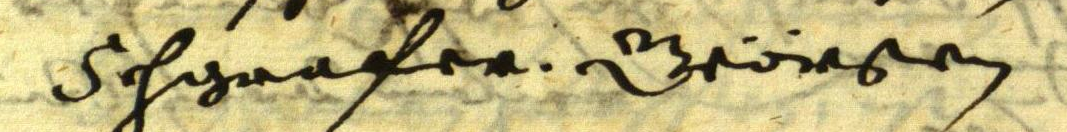Schgrafer. Geörgen
